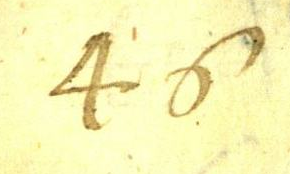46
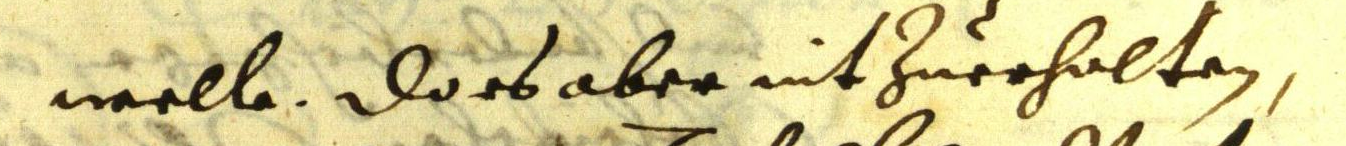welle. Da es aber nit Zūerhalten,
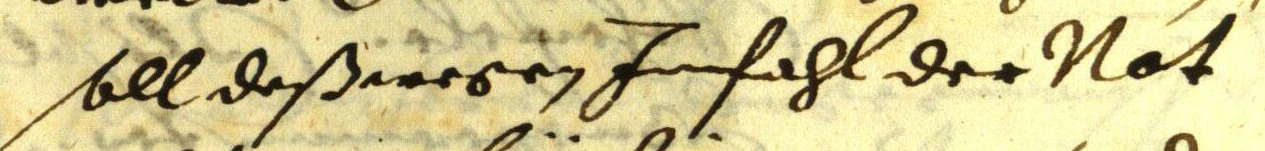soll deßwegen Imfahl der Not
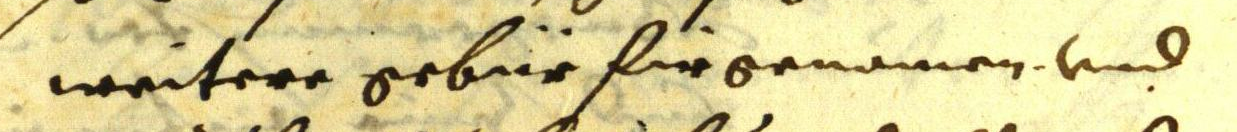weitere gebür fir genomen. vnd
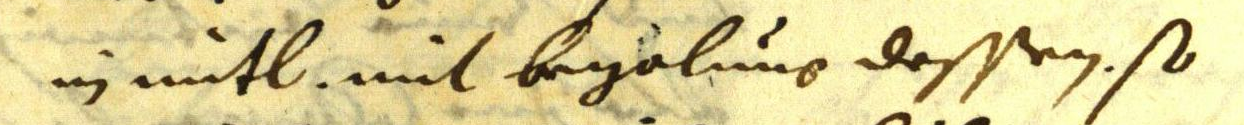in mitl. mit bezalūng dessen. so
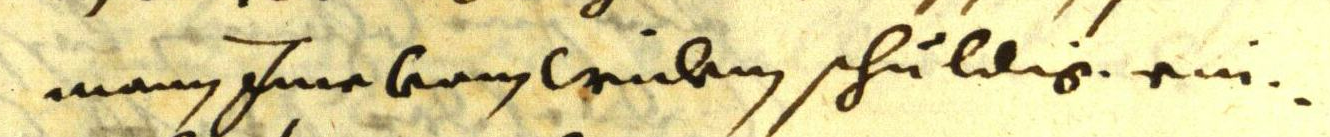man Ime vom Widem schūldig. ein¬
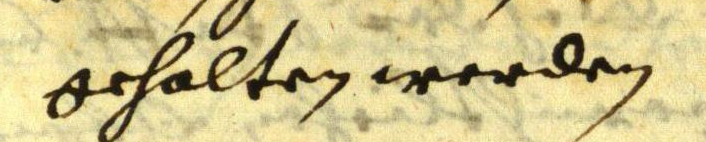gehalten werden
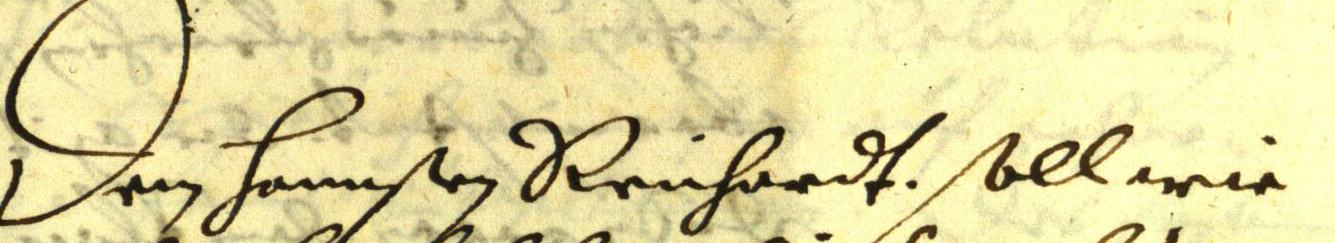Dem hannsen Reichardt. soll wie
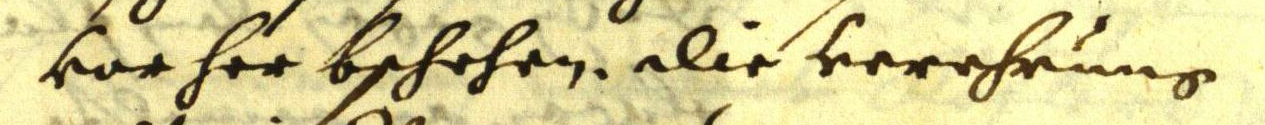vor her beschehen. die verehrūng
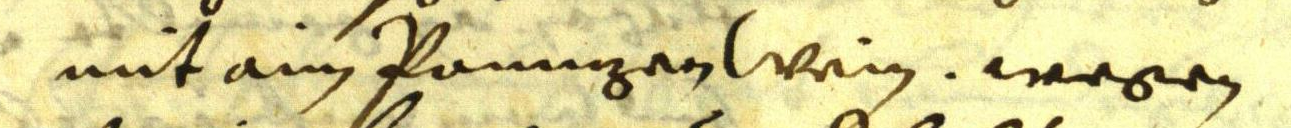mit aim Pannzen Wein. wegen
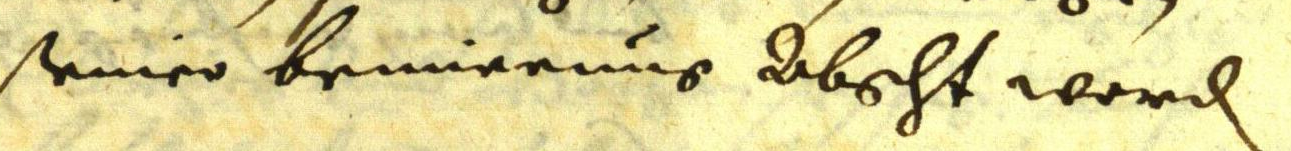seiner bemieeūng Abght werd
